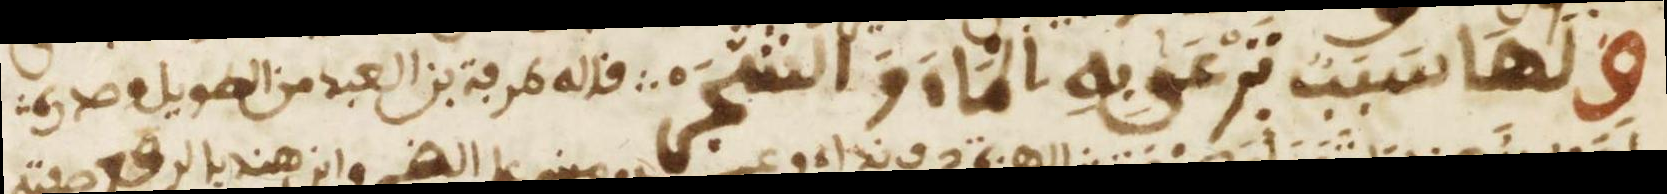ق لها سبب ترعى به الماء و الشجر قاله طرفة بن العبد من الطويل و صدره
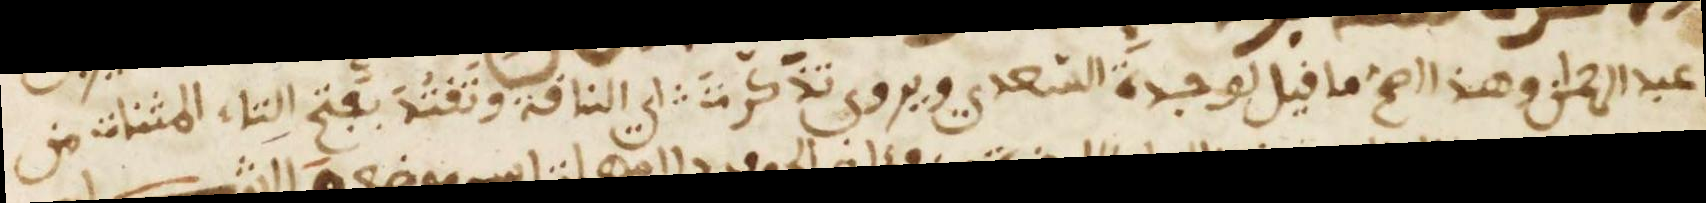عبد الرحمن و هذا الصح ما قيل لوجدة السعدي ويروى تذكرت اي الناقة و تقتد بفتح التاء المثنات من
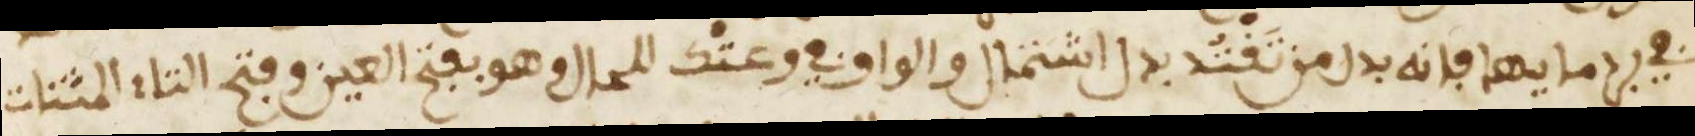في برد مايها فانه بدل من تقتد بدل اشتمال و الواو في وعتك للحال و هو بفتح العين و فتح التاء المثنات
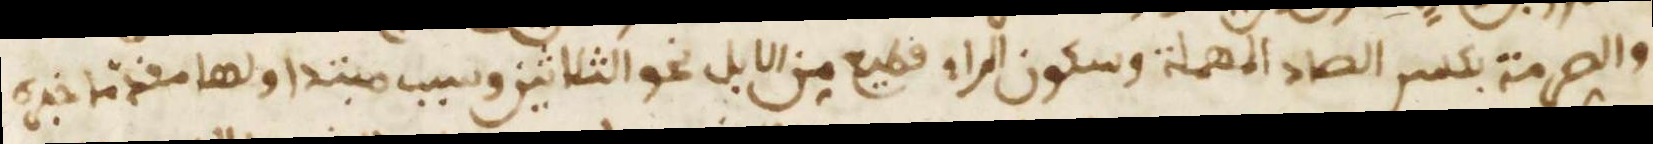و الصرمة بكسر الصاد المهملة و سكون الراء قطيع من الابل نحو الثلاثين و سبب مبتدا و لها مقدما خبره
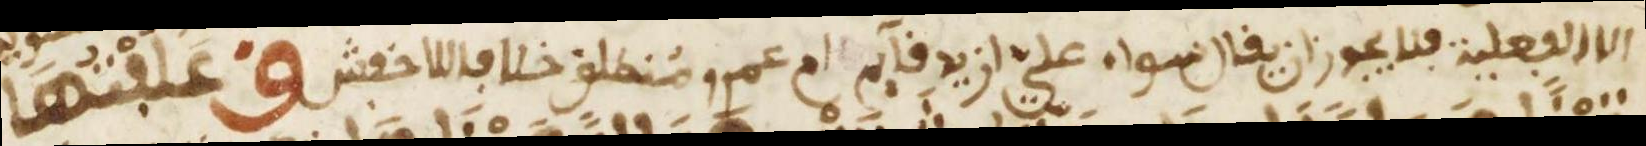الا الفعلية فلا يجوز ان يقال سواء علي ازيد قآئم ام عمرو منطلق خلافا للاخفش ق علفتها
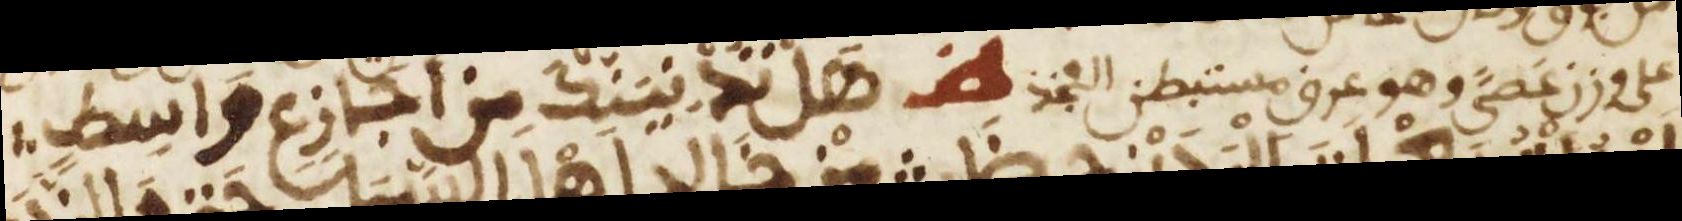على وزن عصى و هو عرق مستبطن الفخذ ظ هل تدنينك من أجازع واسط
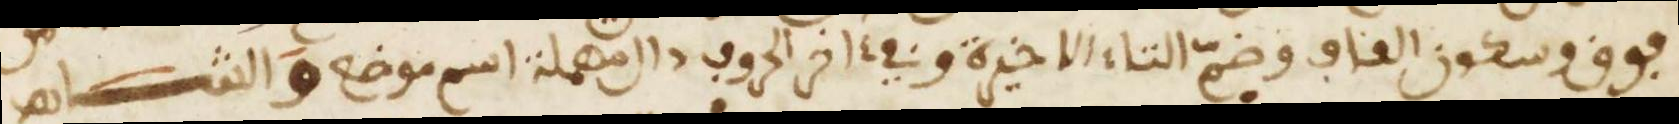فوق و سكون القاف و ضم التاء الاخيرة و في ءاخر الحروف دال مهملة اسم موضع و الشاهد
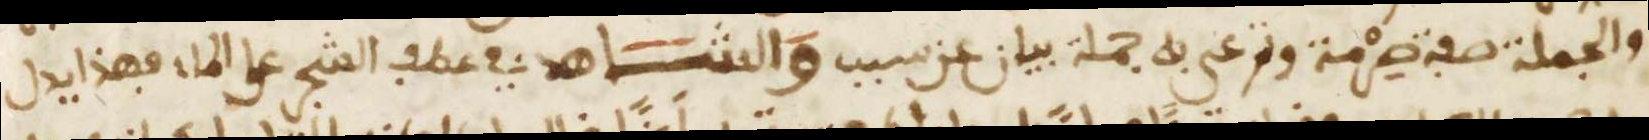و الجملة صفة صرمة و ترعى به جملة بيان عن سبب و الشاهد في عطف الشجر على الماء فهذا يدل
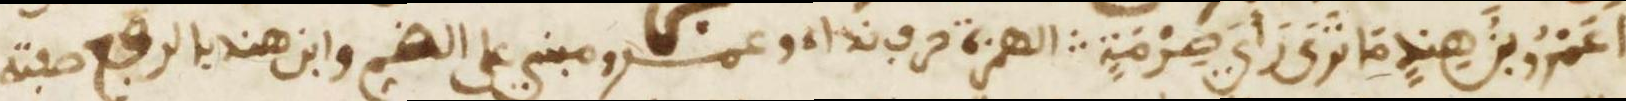اعمرو بن هند ما ترى رأي صرمة الهمزة حرف نداء وعمرو مبني على الضم و ابن هند بالرفع صفته
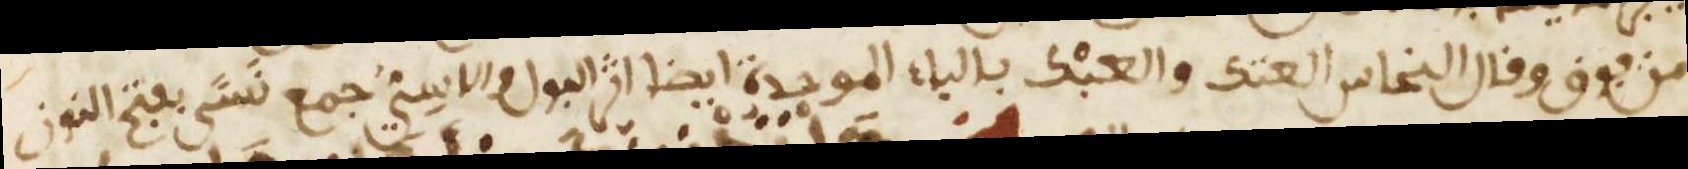من فوق و قال النحاس العتك و العبك بالباء الموحدة ايضا اثر البول و الاسي جمع نسى بفتح النون
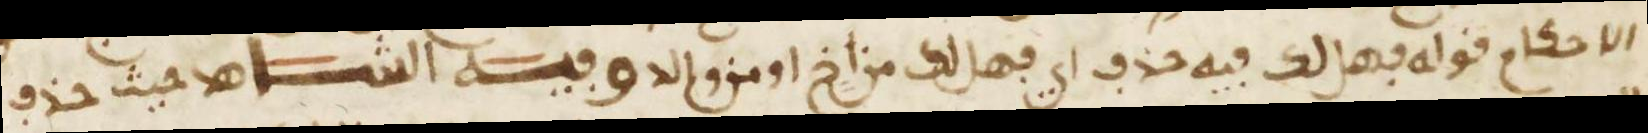الاحكام قوله فهل لك فيه حذف اي فهل لك من أخ او من والد و فيه الشاهد حيث حذف
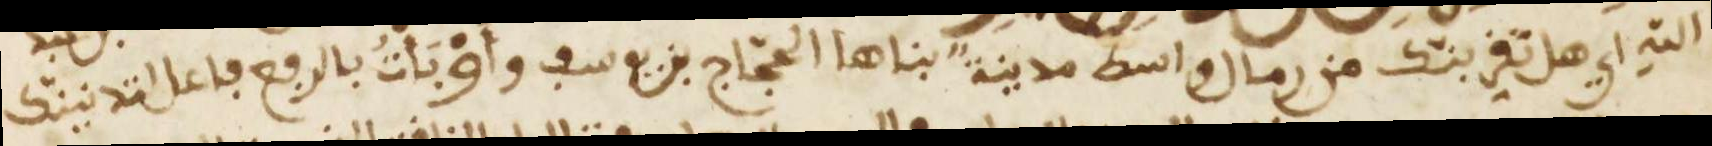الله اي هل تقربنك من رمال واسط مدينة بناها الحجاج بن يوسف و أوبأت بالرفع فاعل لتدنينك
